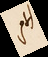الامر
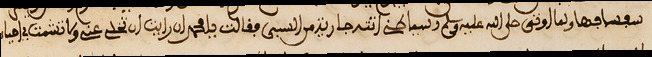سفسا فها ولما اوتى صلى الله عليه وسلم رسيا طنى اتته جارية من السبى فقالت يا محمد ان رايت ان تخلى عنى ولا تشمت في احياء
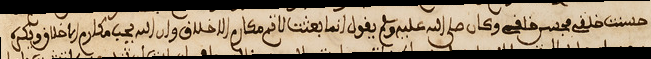حسنت خلقى مجسن خلقى وكان صلى الله عليه وسلم يقول انما بعثت لاتم مكارم الاخلاق وان الله يحب مكارم الاخلاق ويكره
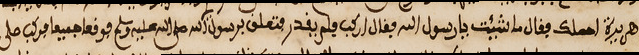هريرة احملك فقال ما شئت يا رسول الله فقال اركب فلم يقدر فتعلق برسول الله صلى الله عليه وسلم فوقعا جميعا فركب صلى
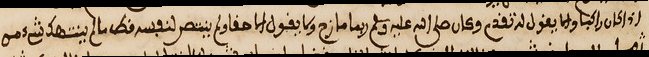اذا كان راكبا والا يقول له تقدم وكان صلى الله عليه وسلم ربما مازح ولا يقول الاحقا ولم ينتصر لنفسه قط ما لم ينتهك شىء من
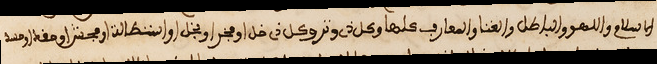الاسلام واللهو والباطل والغنا والمعارف كلها وكل ذى وتر وكل ذى ضل او فجرا ونجل او استطالة او مجش او حقد او حسد
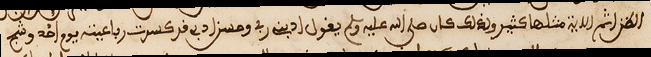الظن اثم الاية مثلها كثير ولك لك كان صلى الله عليه وسلم يقول اد بنى ربي وحسن اد بى قد كسرت رباعيته يوم احد وشج
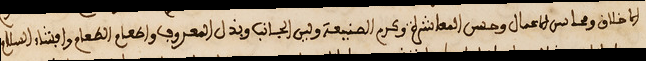الاخلاق ومحاسن الاعمال وحسن المعاشرة وكرم والصنيعة ولين الجانب وبذل المعروف واطعام الطعام وافشاء السلام
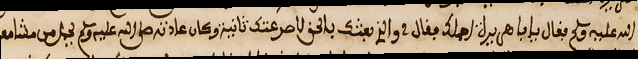الله عليه وسلم فقال يابا هريرة احملك فقال في والذي بعثك بالحق لا صرعتك ثانية وكان عادته صلى الله عليه وسلم يحمل من مشا معه
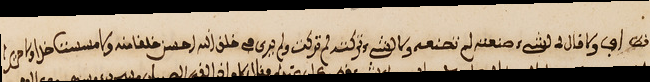قط اف ولا قال لي لشىء صنعته لم تصنعه ولالشىء تركته لم تركت ولم يرى في خلق الله احسن خلقا منه ولا مسست خدا ولا حتى ا
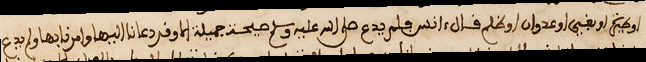اوطيرة او بغي او عدوان او ظلم قال انس فلم يدع صلى الله عليه وسلم صيحة جميلة الاوقد دعانا اليها وامرنا بها ولم يدع
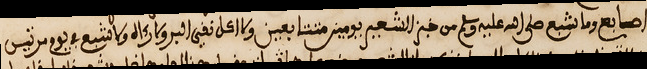اصابع وما شبع صلى الله عليه وسلم من خبر الشعير يومين متتا بعين ولا اكل نقي البر ولا رءاه ولا شبع في يوم مرتين
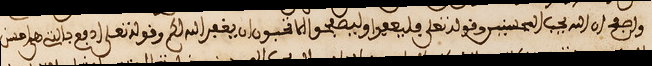ولن ص## ان الله يحب المحسنين وقوله تعلى فليعفرا وليصفحوا لال تحبون ان يغفر الله لكم وقوله تعلى ادفع بالتى هى احسن
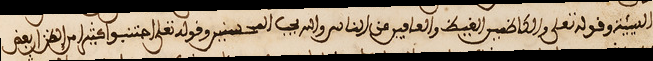السيئة وقوله تعلى والكاظين الغيظ والعافين عن الناس والله يحب المحسنين وقوله تعلى احتنبو اكثيرا من الظن ان بعض
